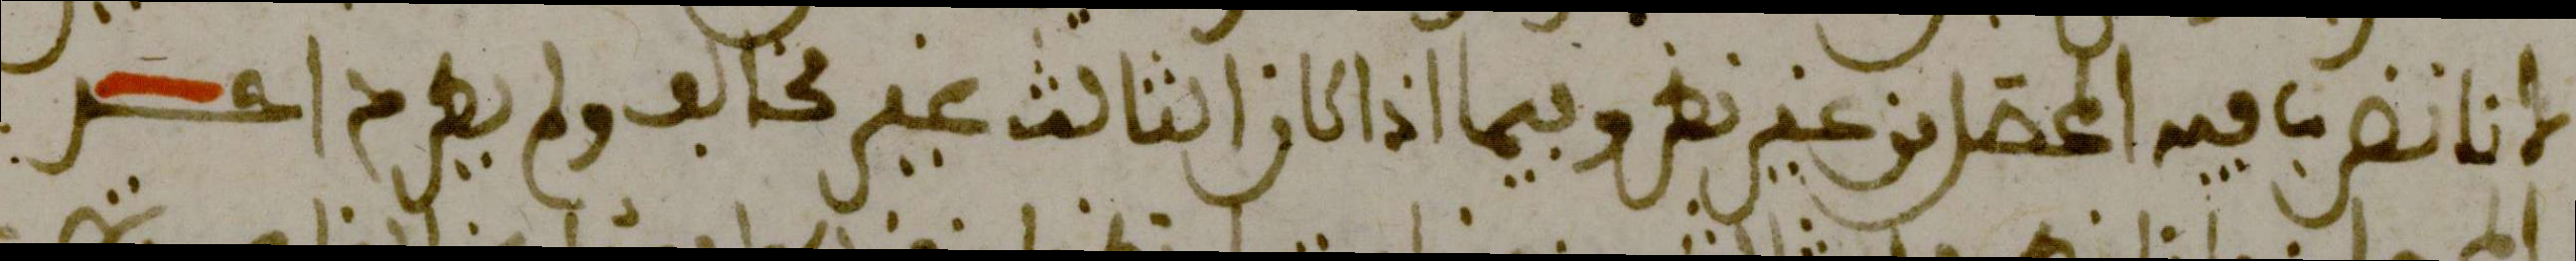لانا نضرب فيه المحصَل من غير نظر وفيما اذا كان الثالث غير مخالف يطرح احد
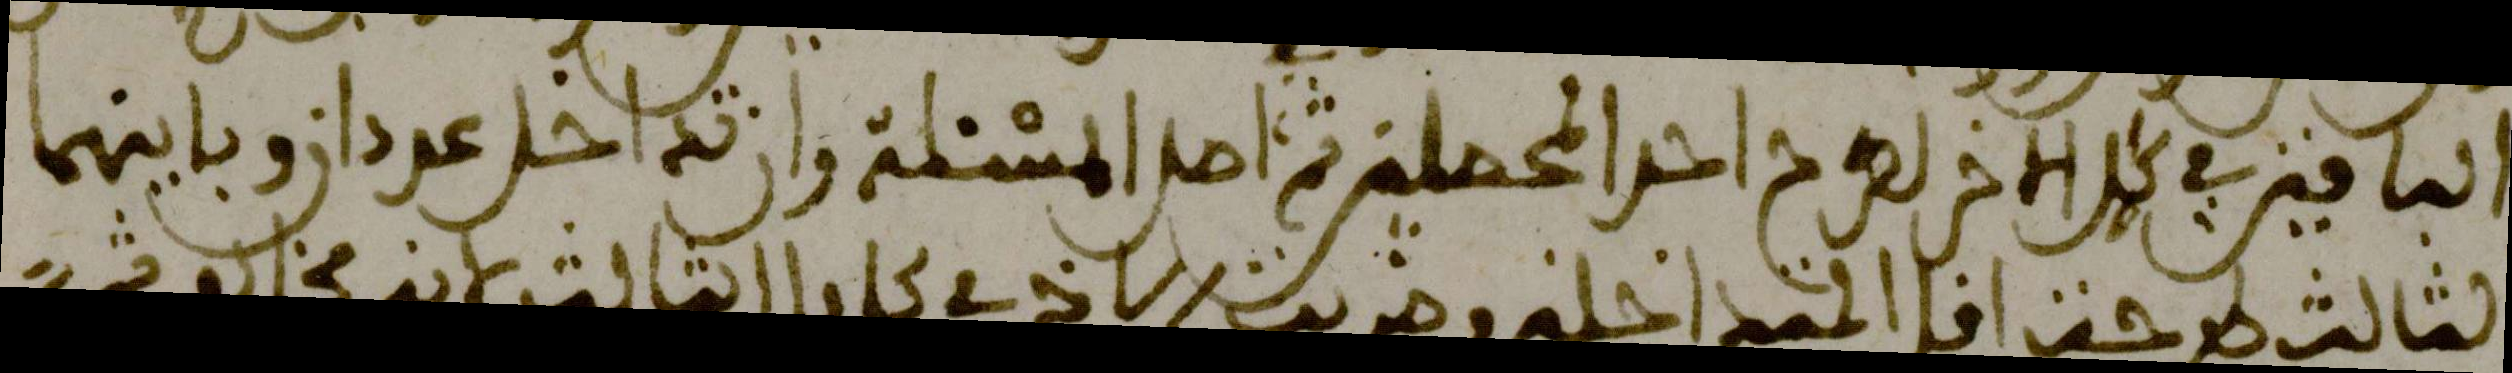الباقين في كامل الاخر لطرح احدد المحصلين ثم اصل المسْئلة وان تداخل عددان وباينهما
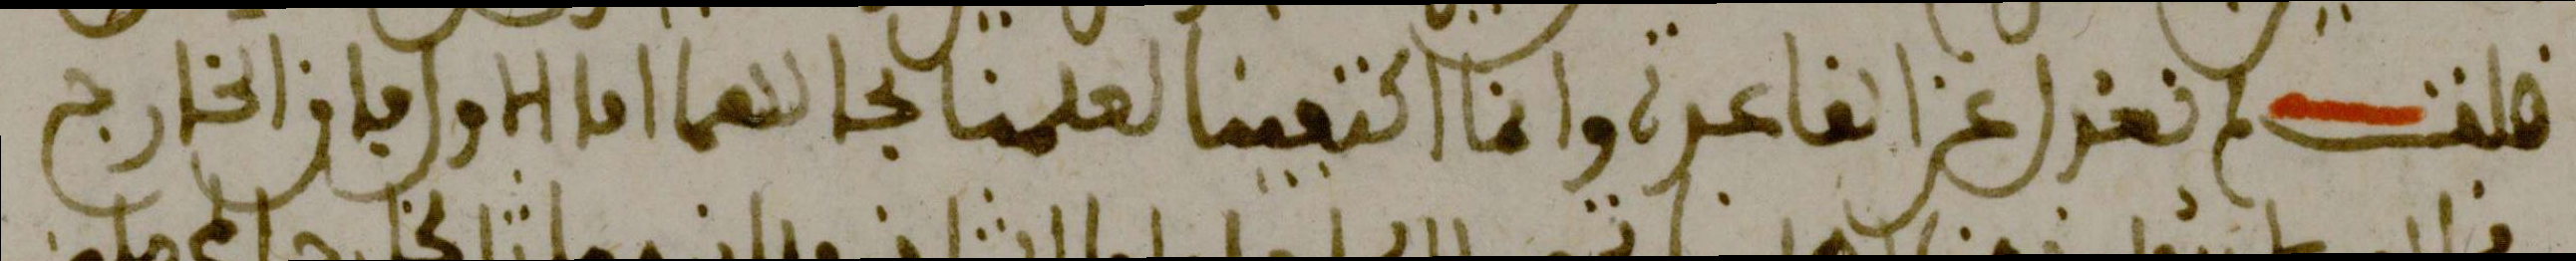قلتَ لم نعدل عن القاعدة وانما كتفينا لعلمنا بحالهما اما الاول فان الخارج
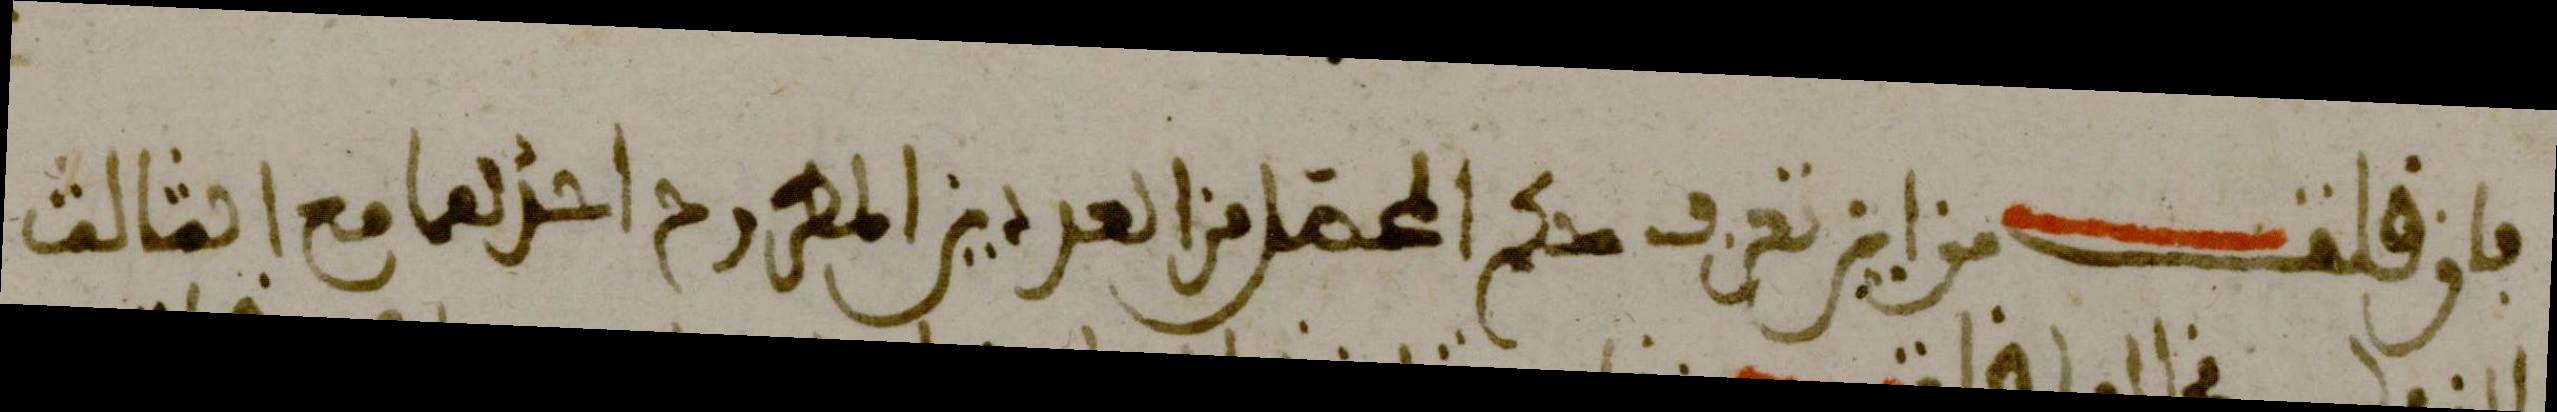فان قلت من اين تعرف حكم المحصل من العددين المطروح احد مع الثالث
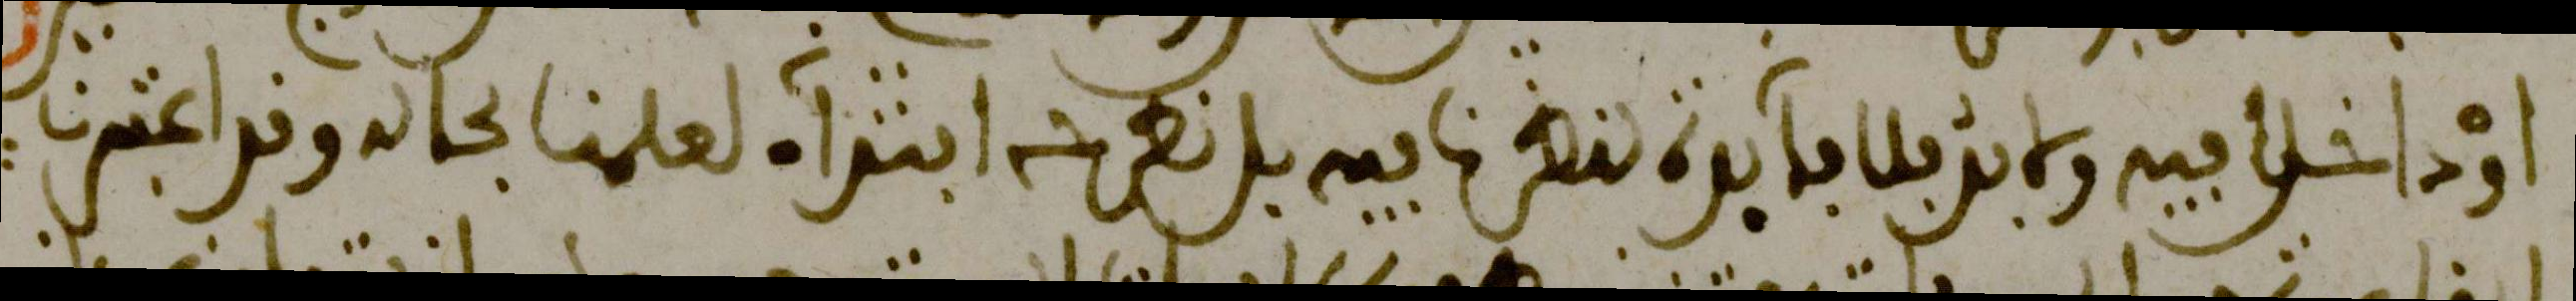اوْ داخل فيه ولا بد فلا فائدة لنظرن فيه بل نطرحه ابتداء لعلمنا بحاله وقد اعتبرن
